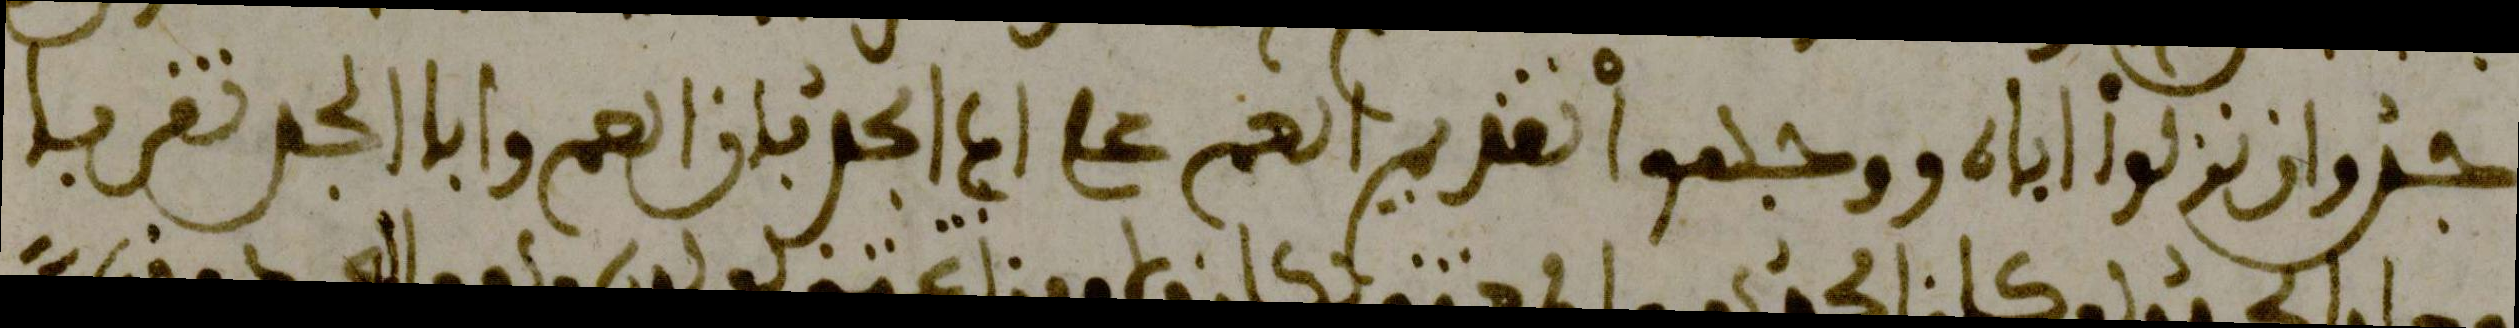جد وان نزلوا اياه وجهوا تقديم العم على ابي الجد بان العم وابا الجد تقربا
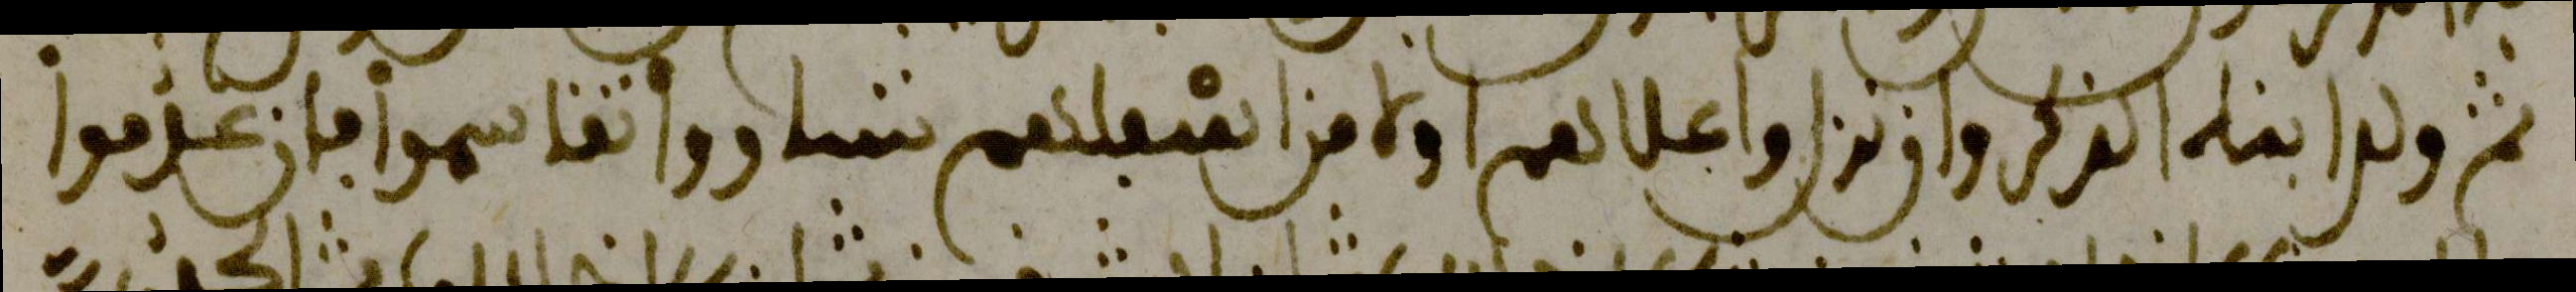ثم ولد ابنه الذكر وان نزل واعلاهم اولا من اسفلهم تساو وا تقاسموا فان عدموا
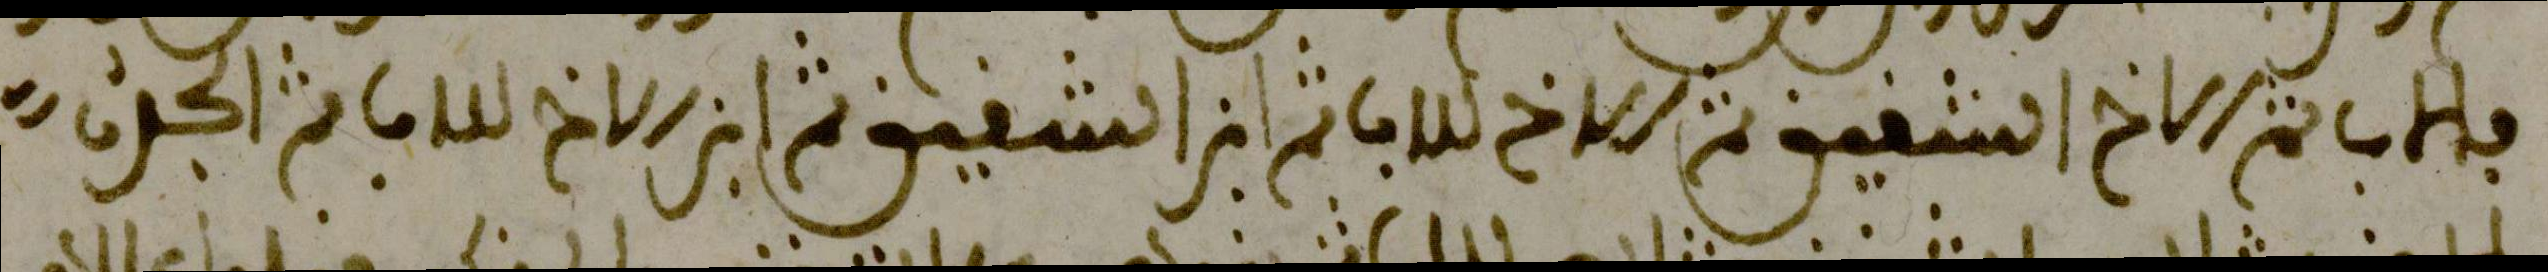فالاب ثم الاخ الشقيق ثم الاخ للاب ثم ابن الشقيق ثم ابن الاخ للاب ثم الجد
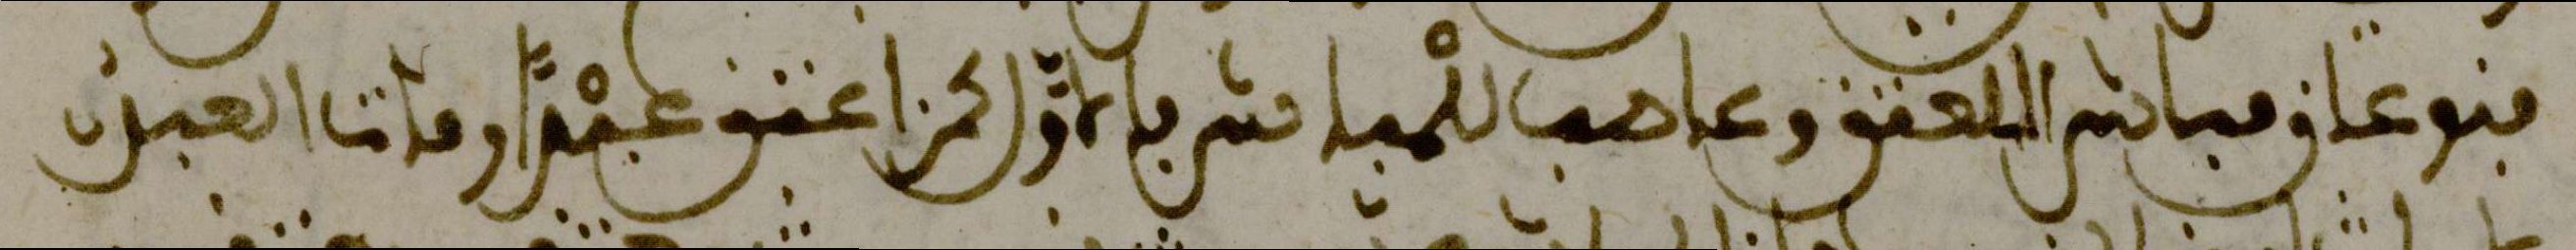فنوعان مباشر اللعتق وعاصب للمباشر فالاوّل كمن اعتق عبد او مات العبد
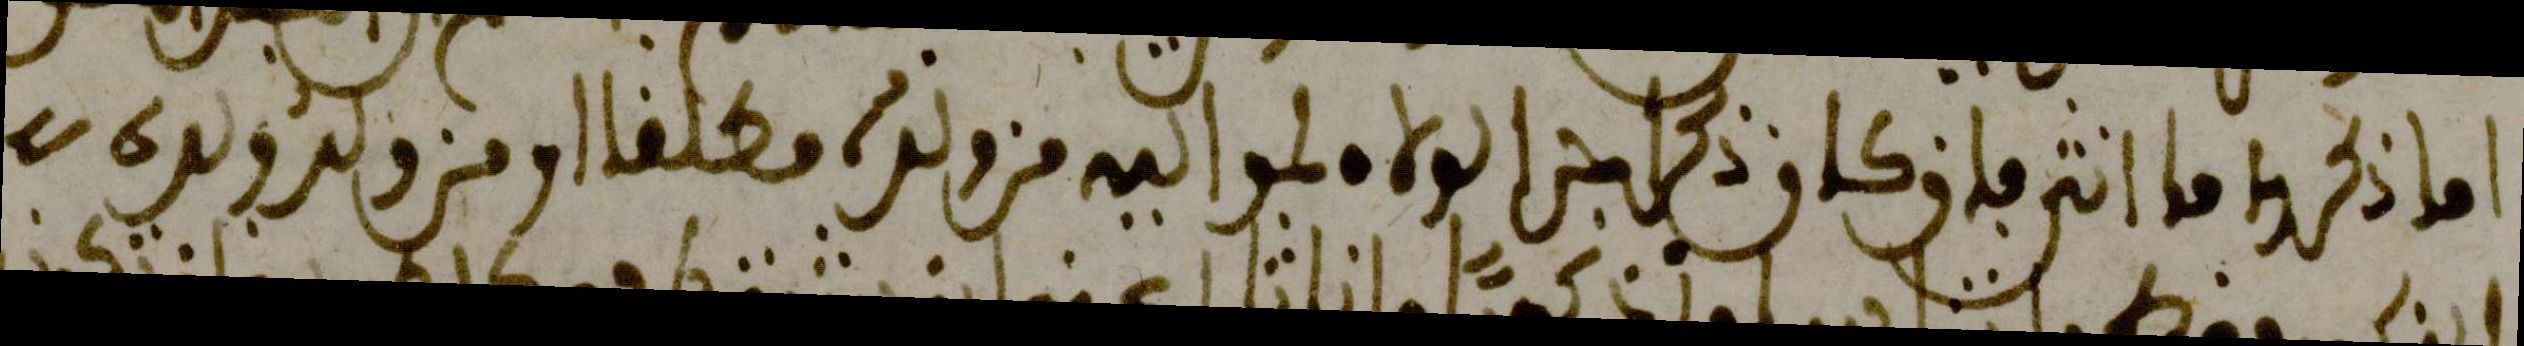اما ذكروا ما انثى فان كان ذكر اجر الولاء لمواليه من ولده مطلقا او من ولد ولده
